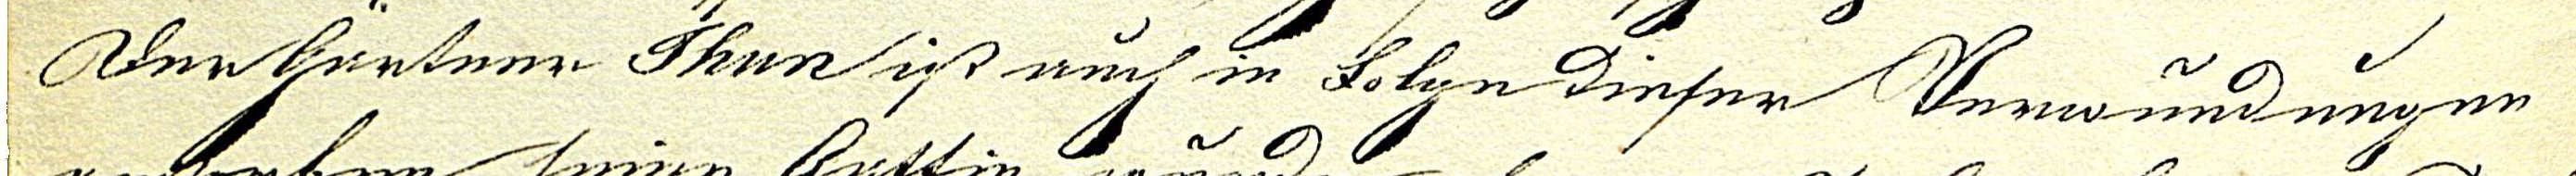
Der Gärtner Thun ist auch in Folge dieser Verwundungen
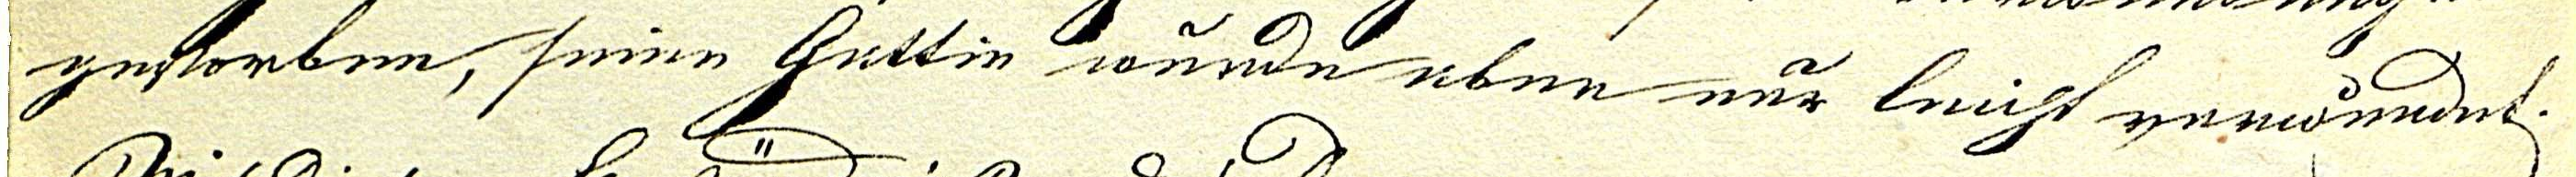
gestorben, seine Gattin wurde aber nur leicht verwundet.
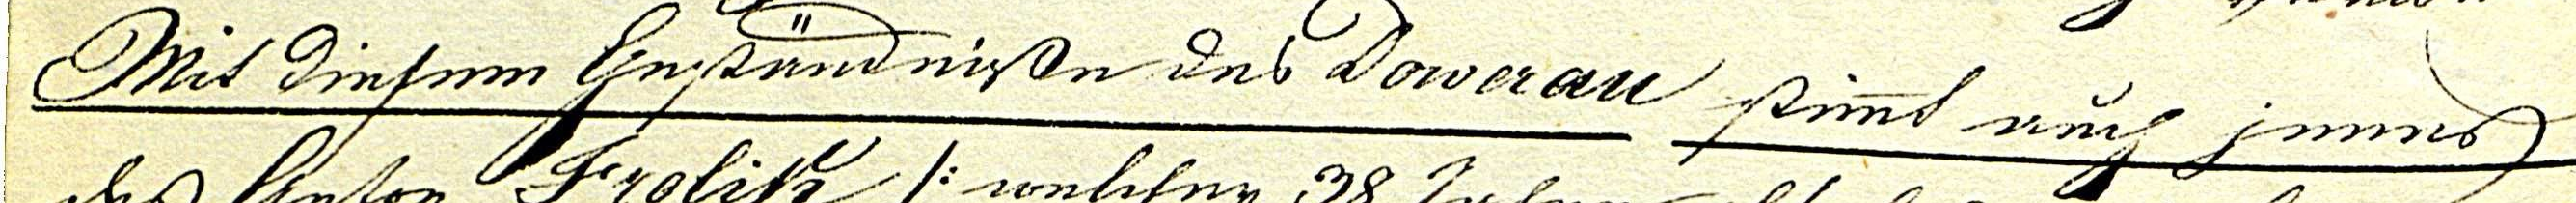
Mit diesem Geständniße des Dowerau stimmt auch jenes
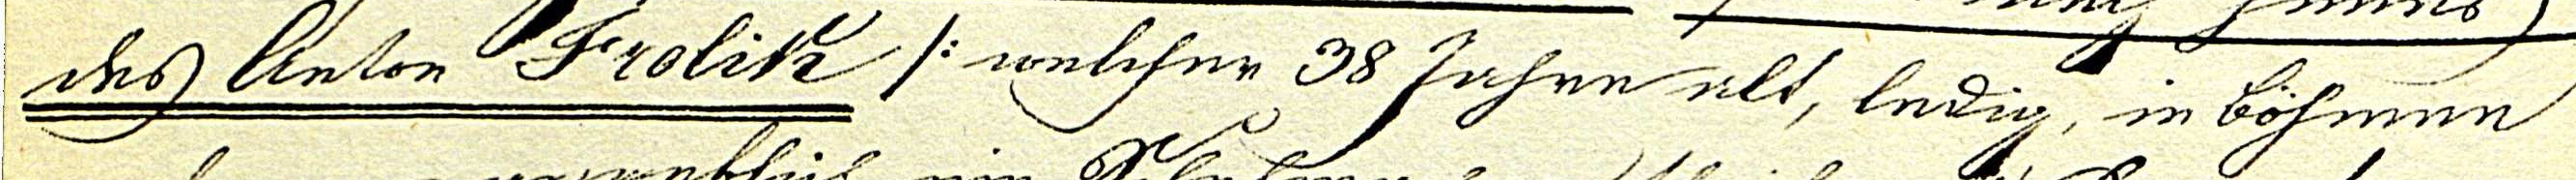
des Anton Frolik (welcher 38 Jahre alt, ledig, in Böhmen
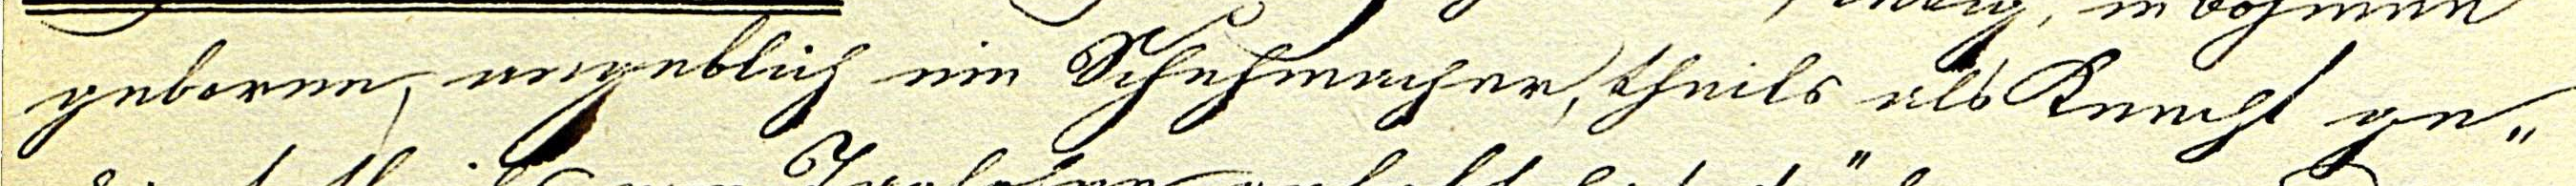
geboren, angeblich ein Schuhmacher, theils als Knecht ge¬
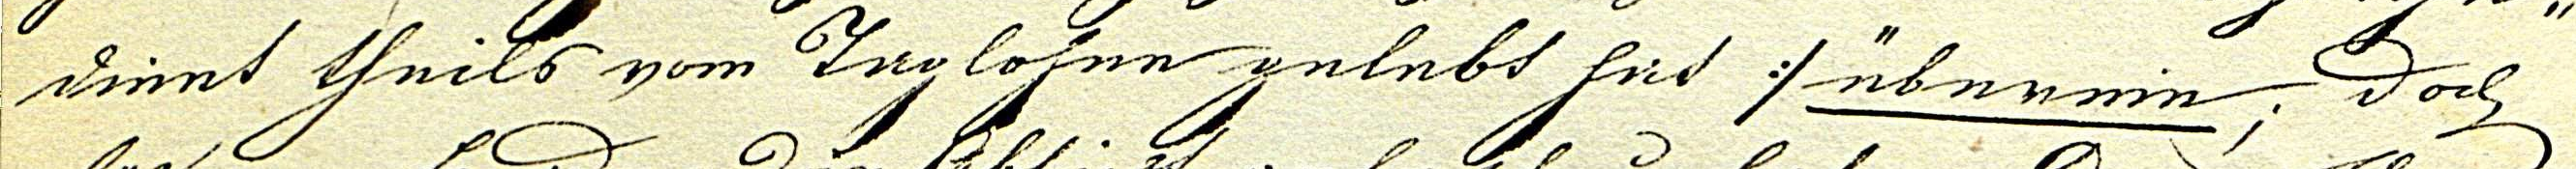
dient theils vom Taglohne gelebt hat) überein; doch
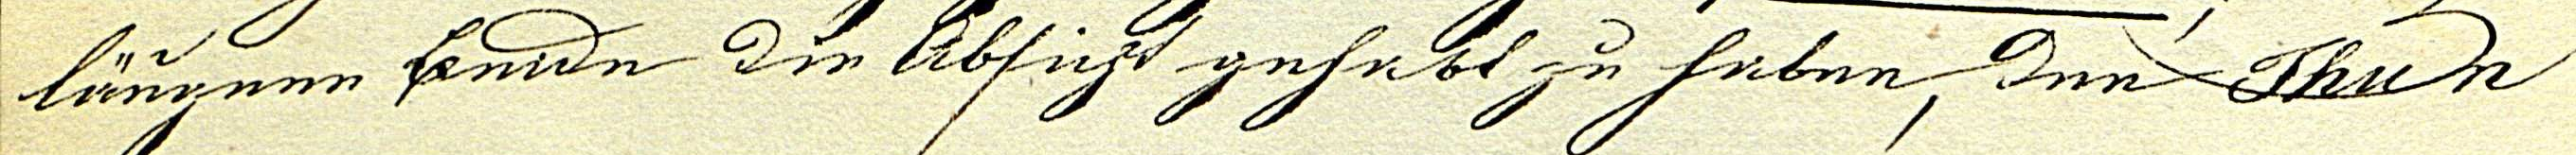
läugnen beide die Absicht gehabt zu haben, den Thun
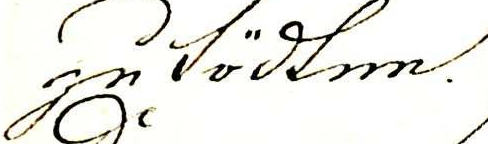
zu tödten.
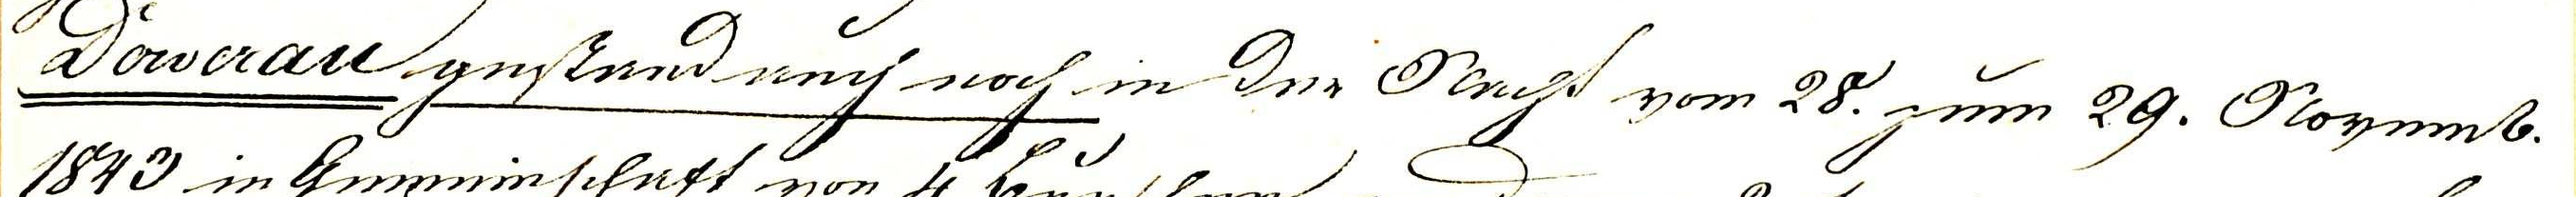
Dowerau gestand auch noch in der Nacht vom 28. zum 29. November
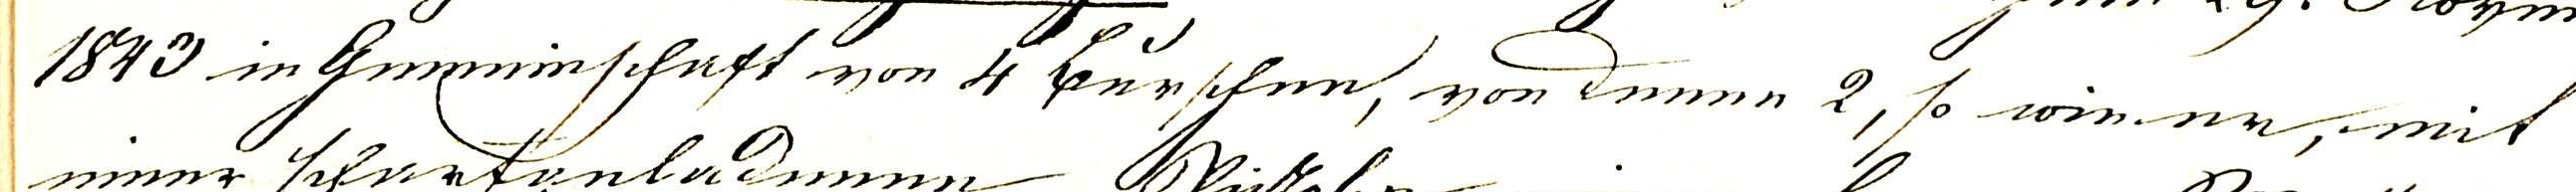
1843 in Gemeinschaft von 4 Burschen, von denen 2, so wie er, mit
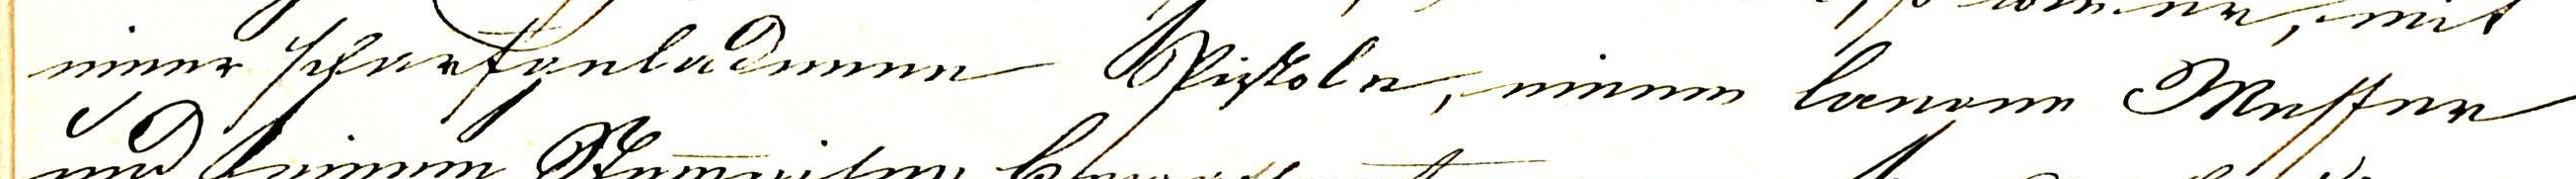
einer scharfgeladenen Pistole, einen langen Messer
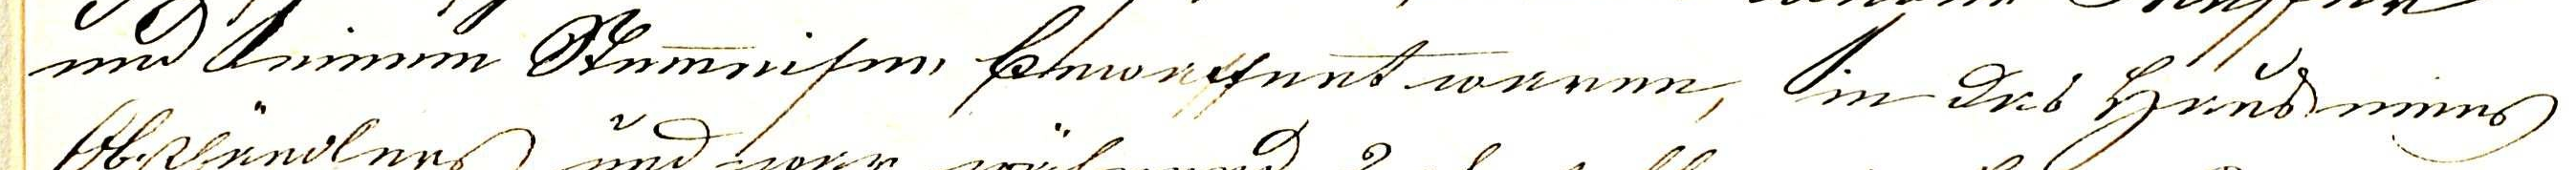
und einem Stemmeisen, bewaffnet waren, in das Haus eines
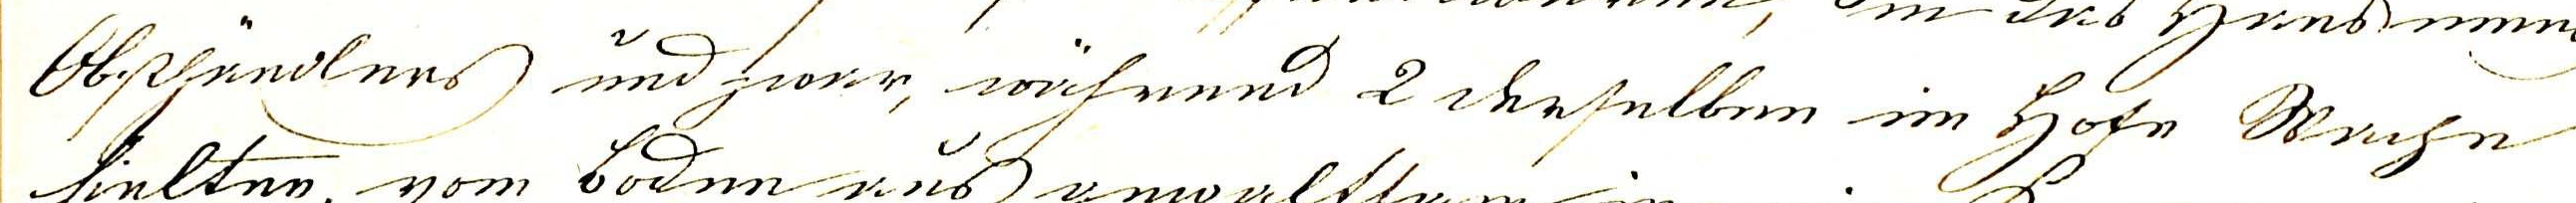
Obsthändlers und zwar, während 2 derselben im Hofe Wache
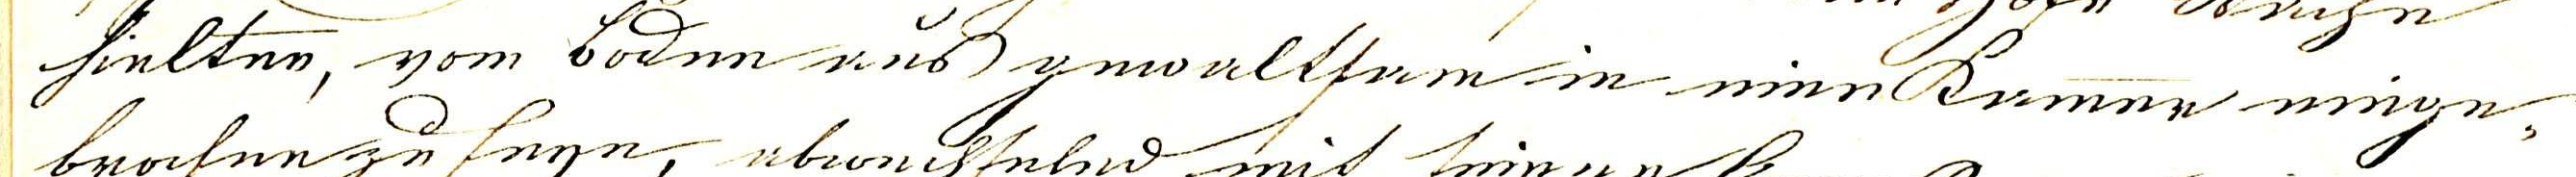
hielten, vom Boden aus gewaltsam in eine Kammer einge¬
